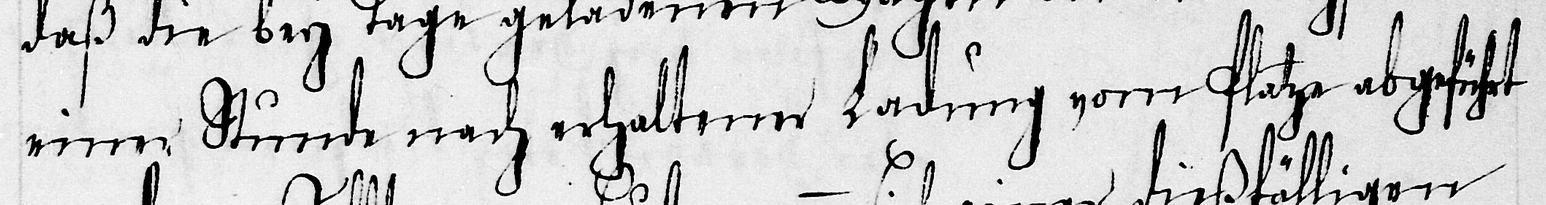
einer Stunde nach erhaltener Ladung vom Platze abgeführt
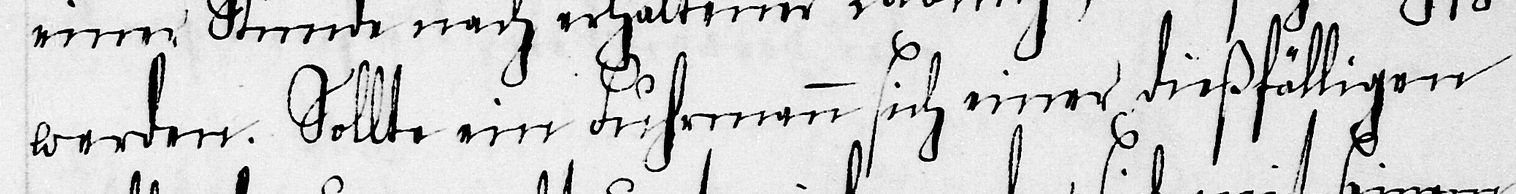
werden. Sollte ein Fuhrmann sich einer dießfälligen
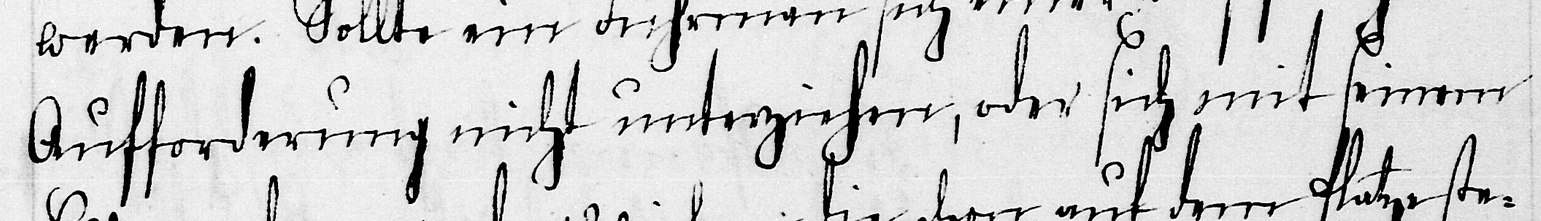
Aufforderung nicht unterziehen, oder sich mit seinem
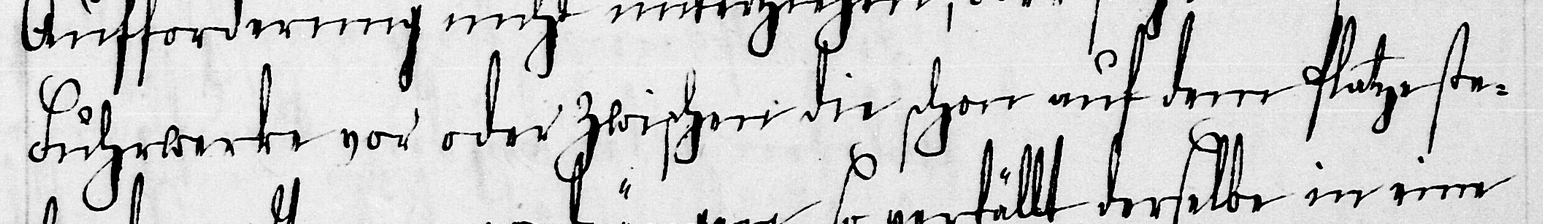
Fuhrwerke vor oder zwischen die schon auf dem Platze ste¬
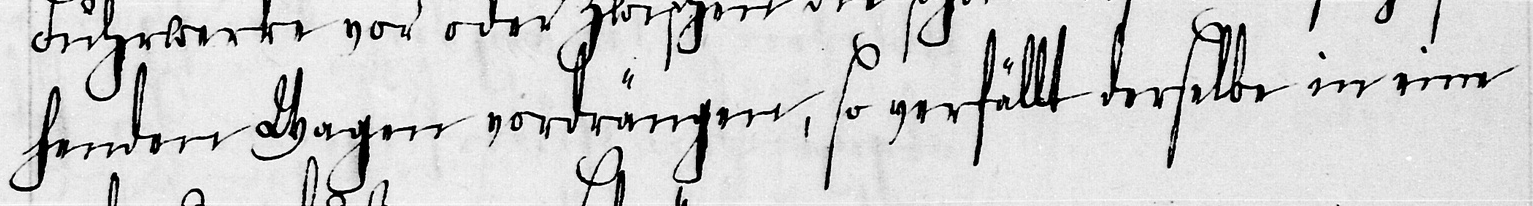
henden Wagen vordrängen, so verfällt derselbe in eine
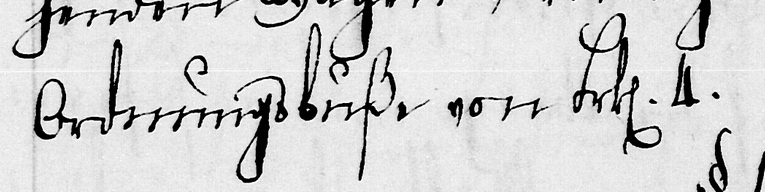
Ordnungsbuße von Frk[en].
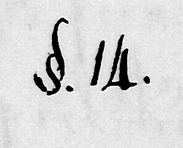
§. 14.
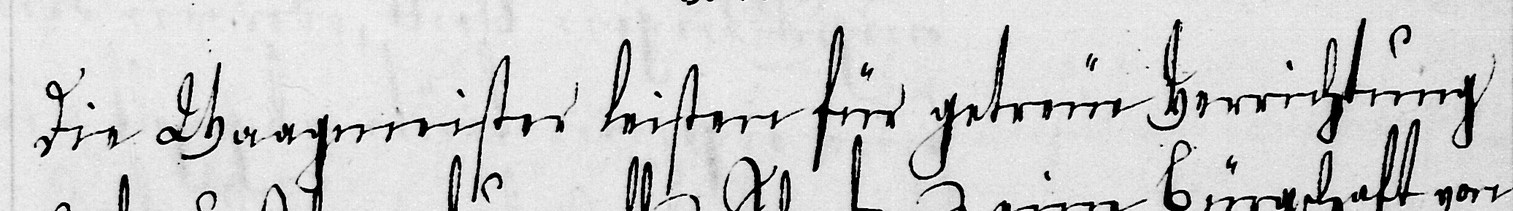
Die Waagmeister leisten für getreue Verrichtung
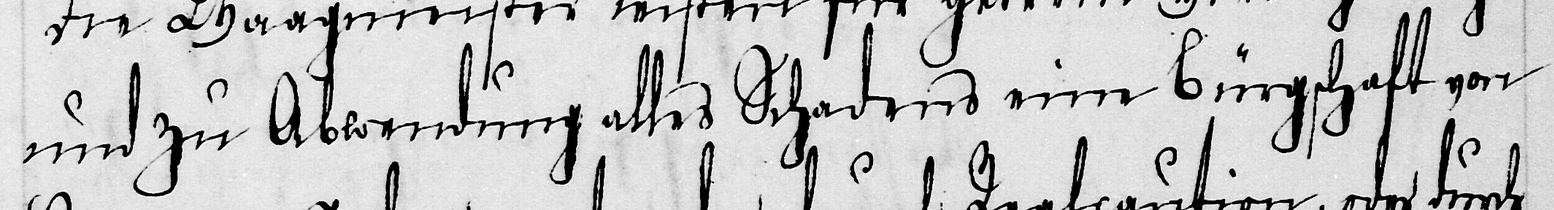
und zu Abwendung alles Schadens eine Bürgschaft von
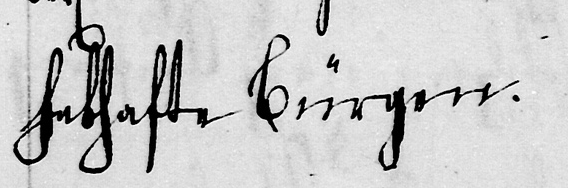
habhafte Bürgen.
